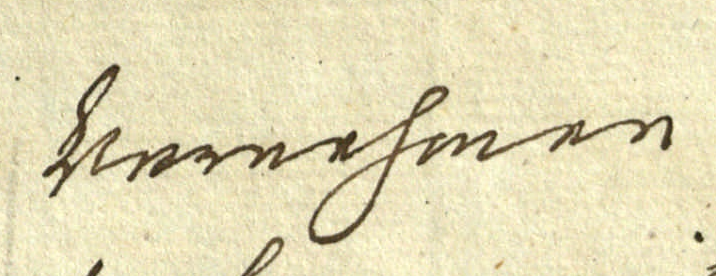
vernehmen
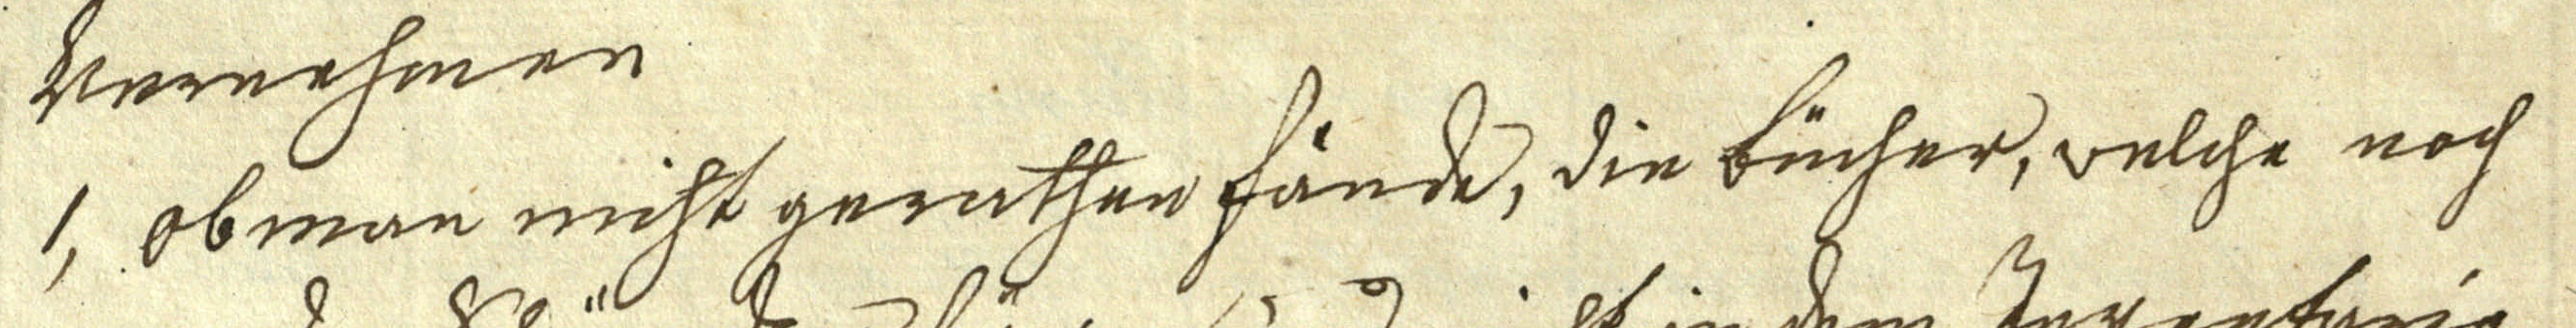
1, ob man nicht gerathen fände, die Bücher, welche noch
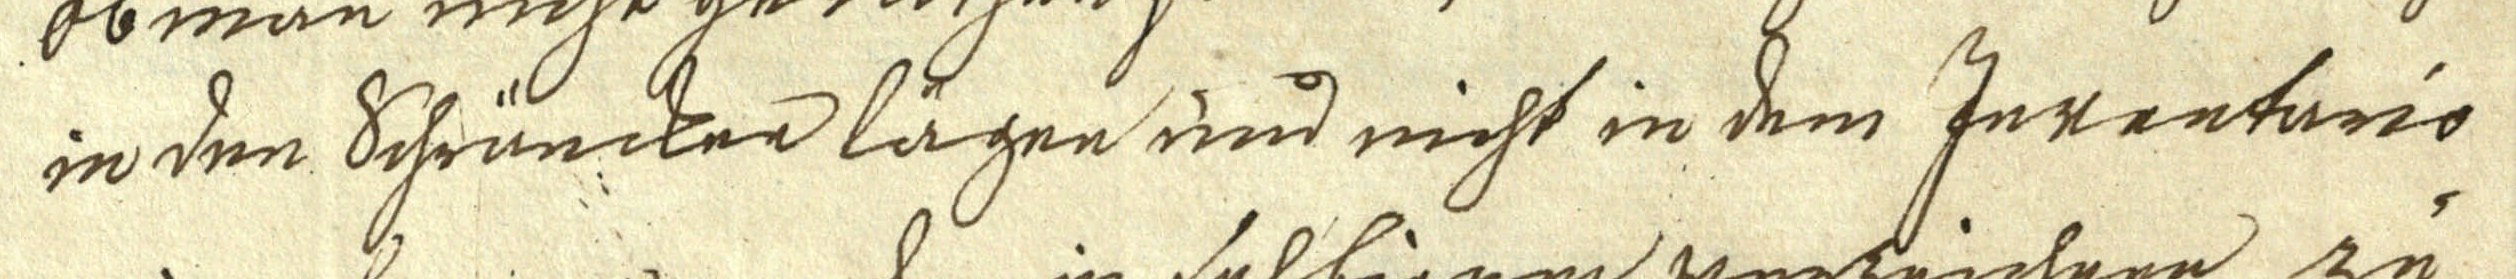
in den Schräncken lägen und nicht in dem Inventario
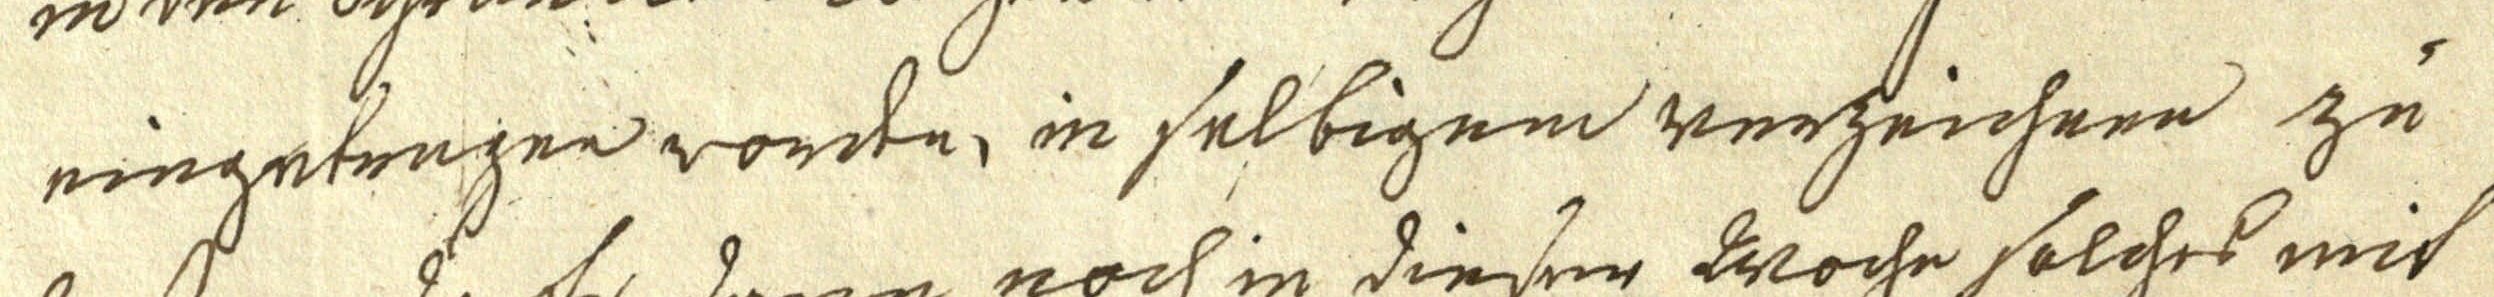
eingetragen worden, in selbigem verzeichnen zu
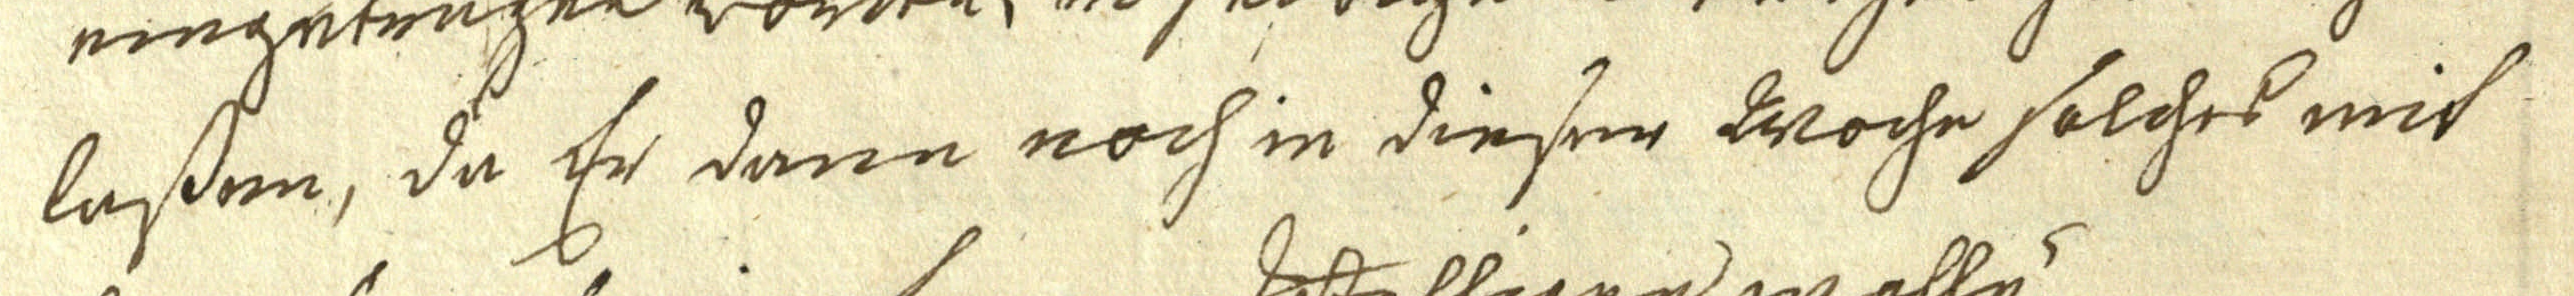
laßen, da Er dann noch in dieser Woche solches mit
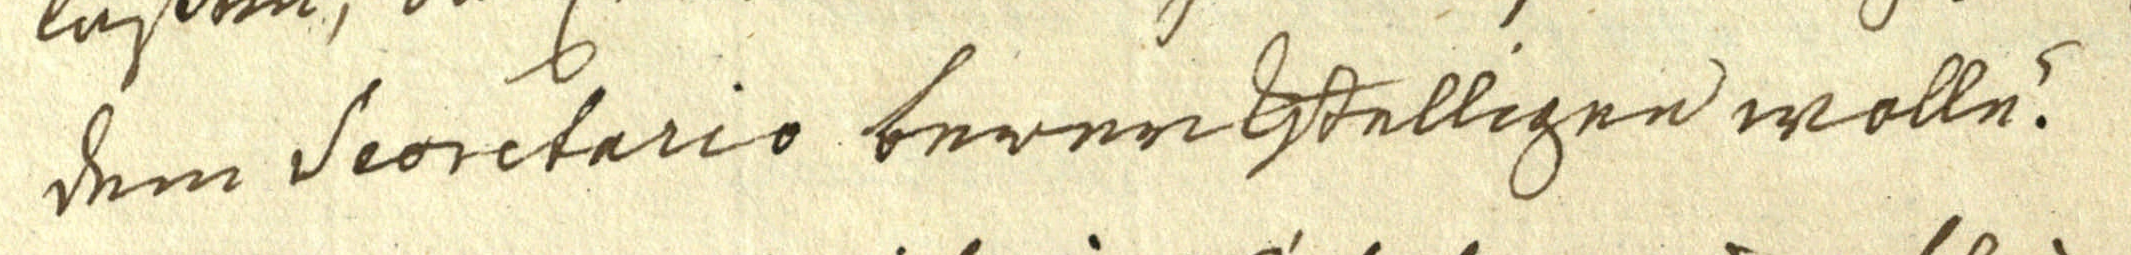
dem Secretario bewerckstelligen wolle?
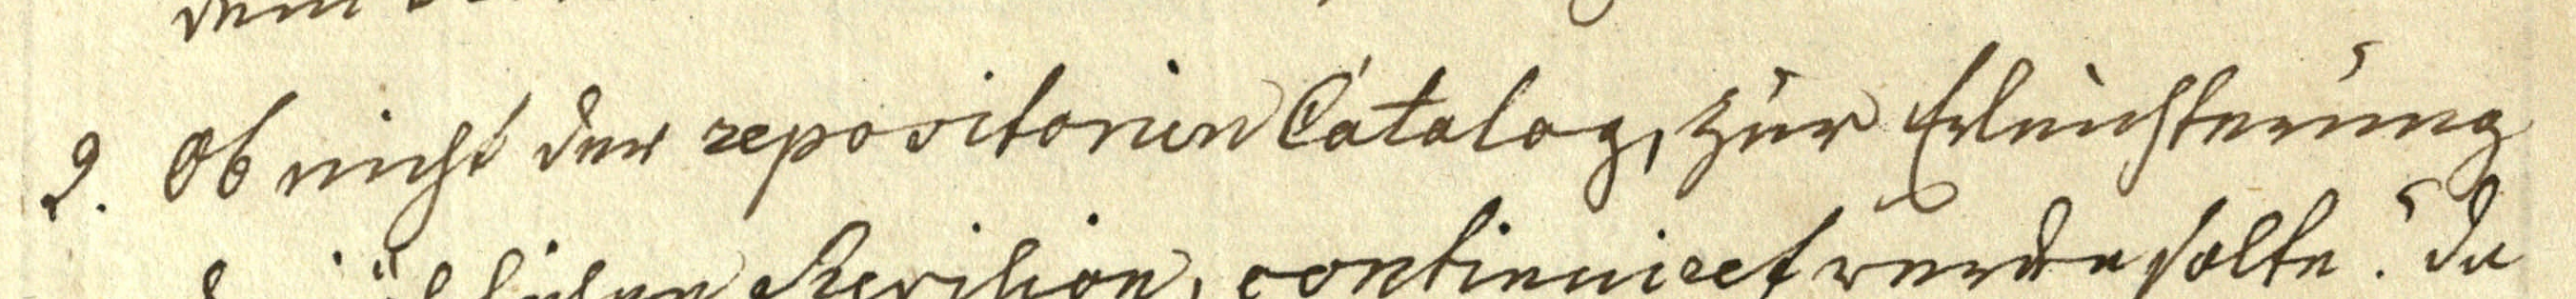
2. Ob nicht der Repositorien Catalog, zur Erleichterung
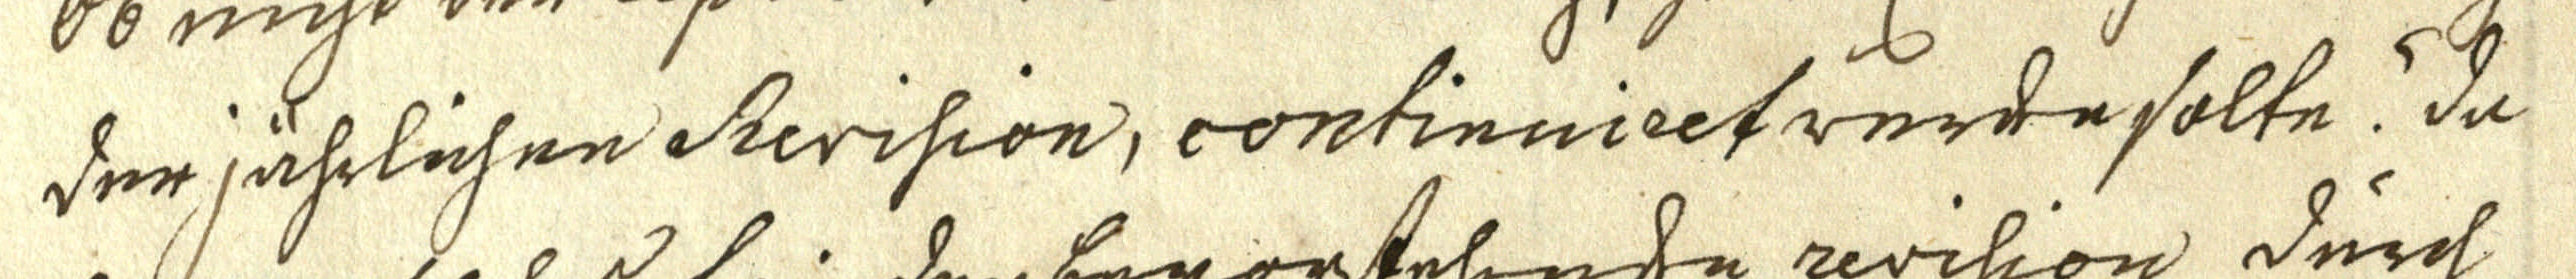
der jährlichen Revision, continuiret werden solte? Da
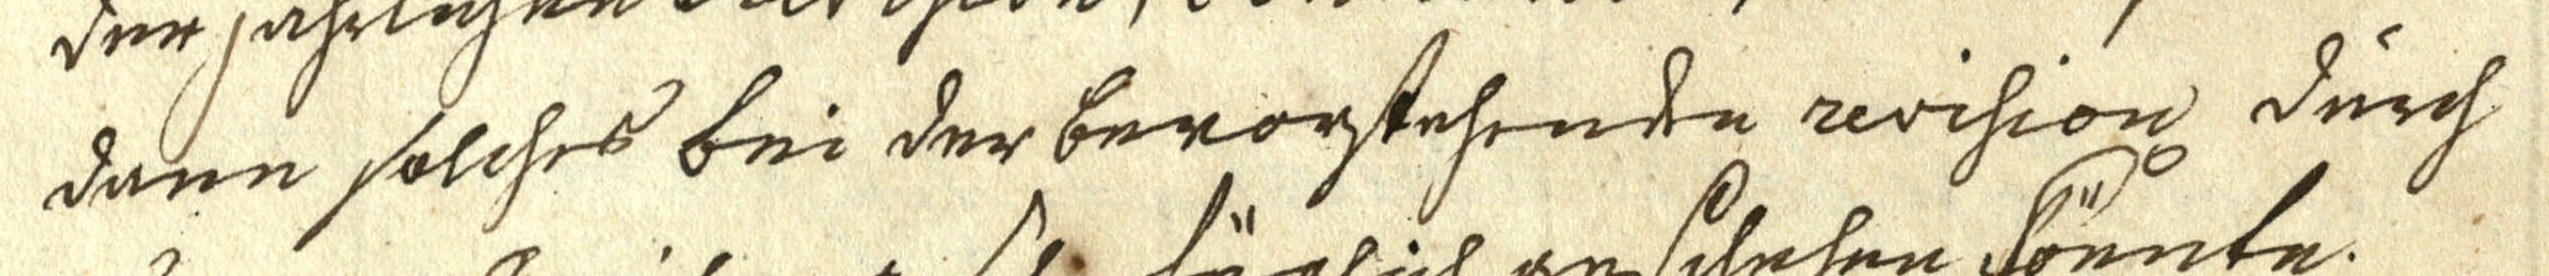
dann solches bei der bevorstehenden revision durch
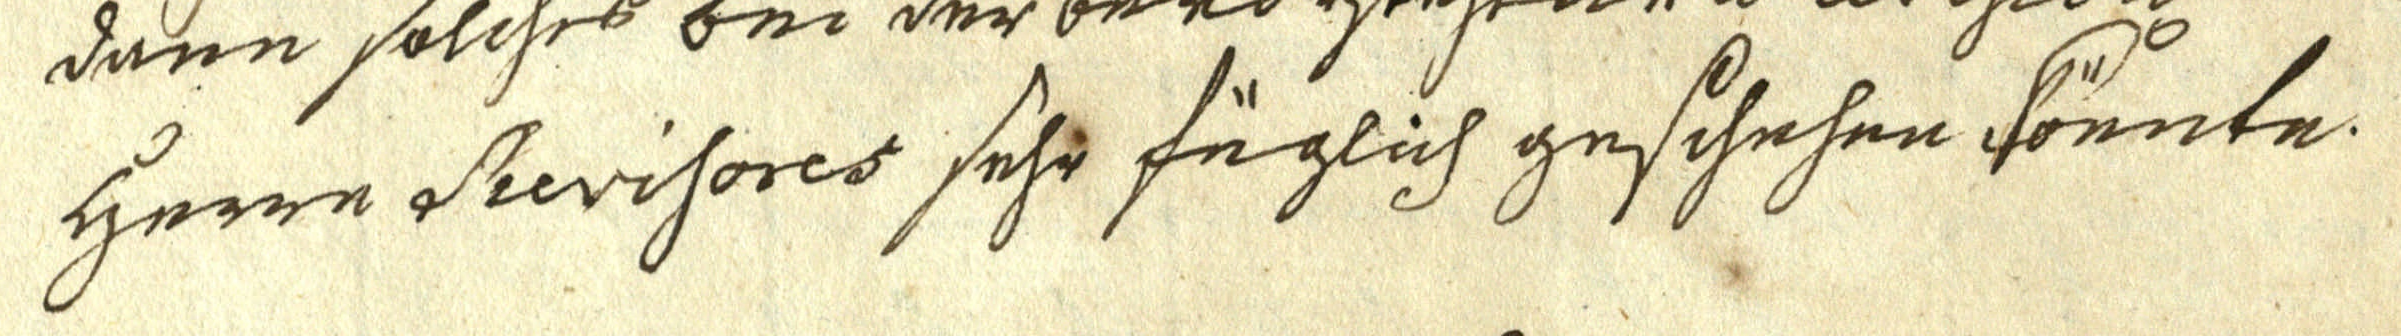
Herrn Revisores sehr füglich geschehen könnte.
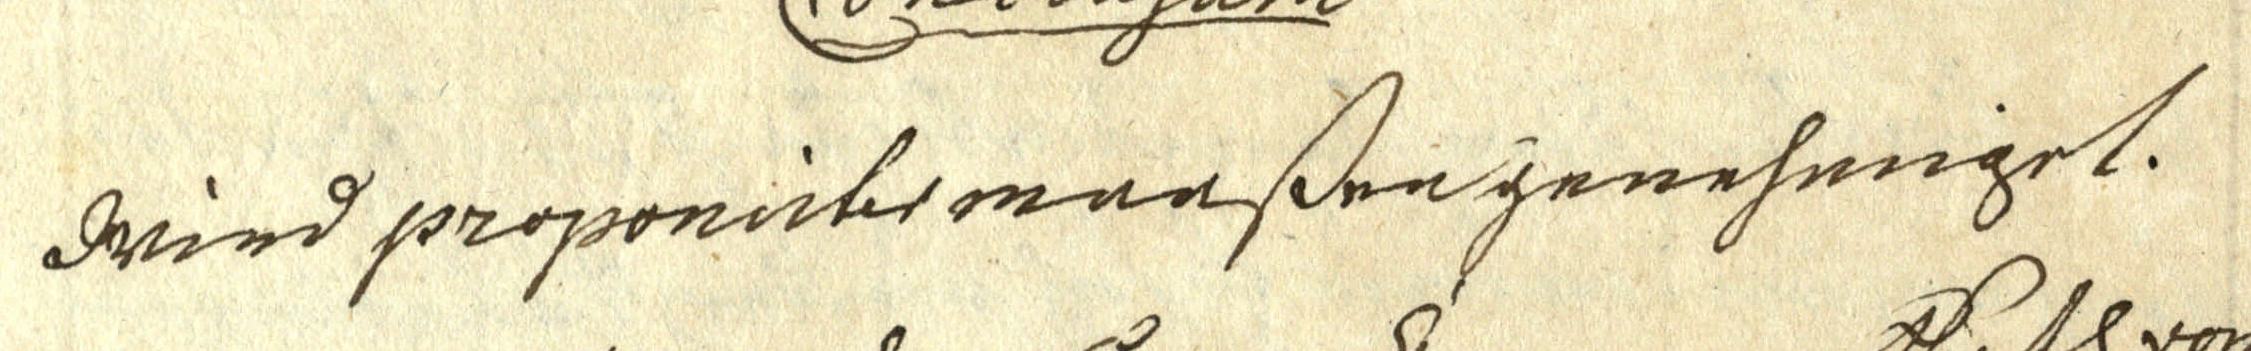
Wird proponirter maaßen genehmiget.
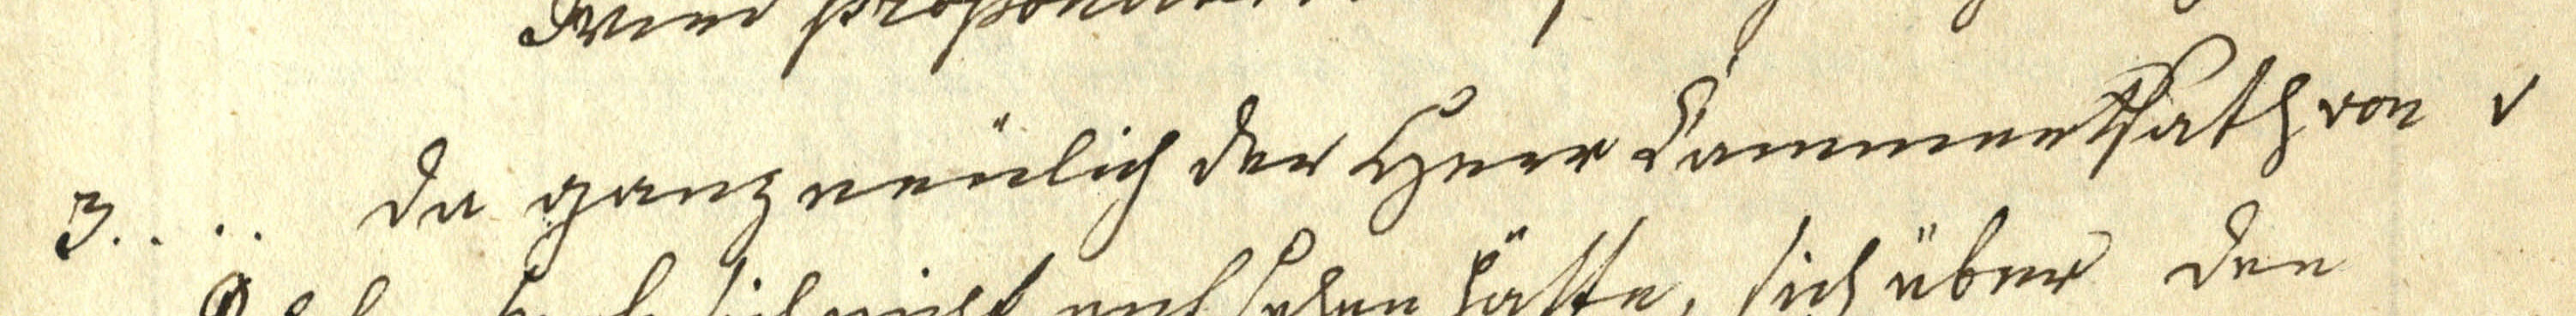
3. da ganz neulich der Herr CammerRath von
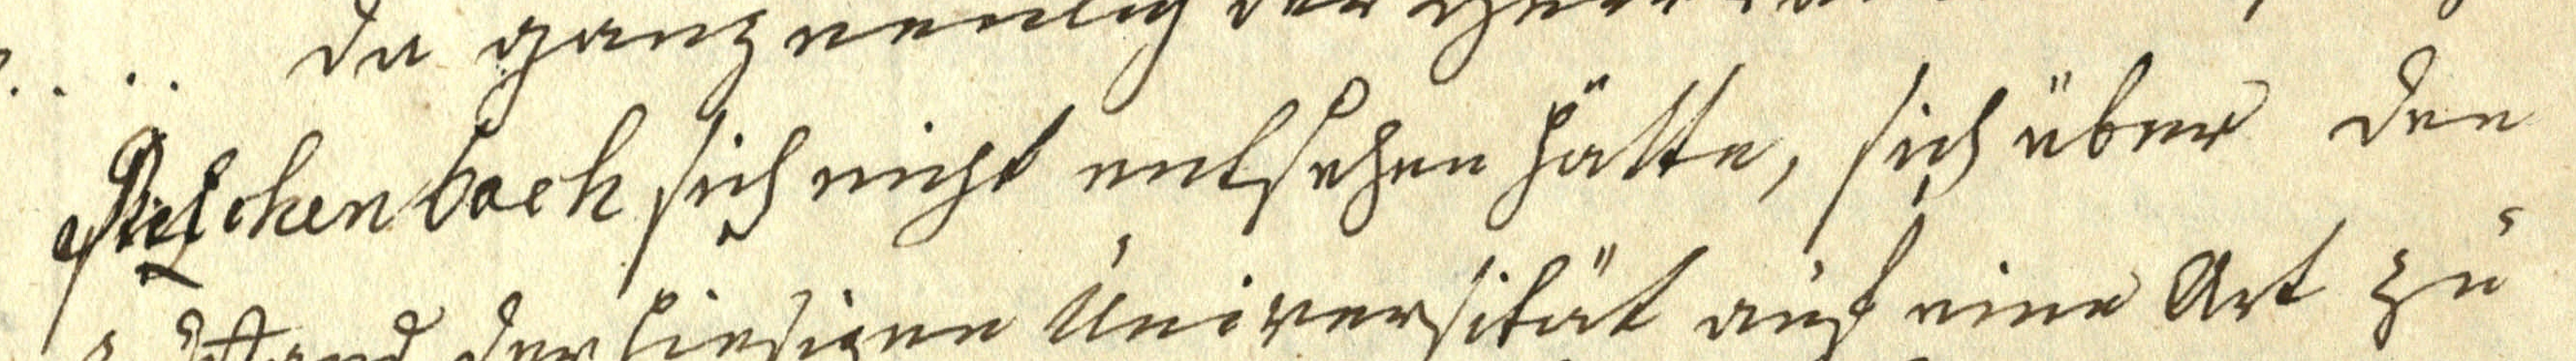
Reichenbach sich nicht entsehen hätte, sich über den
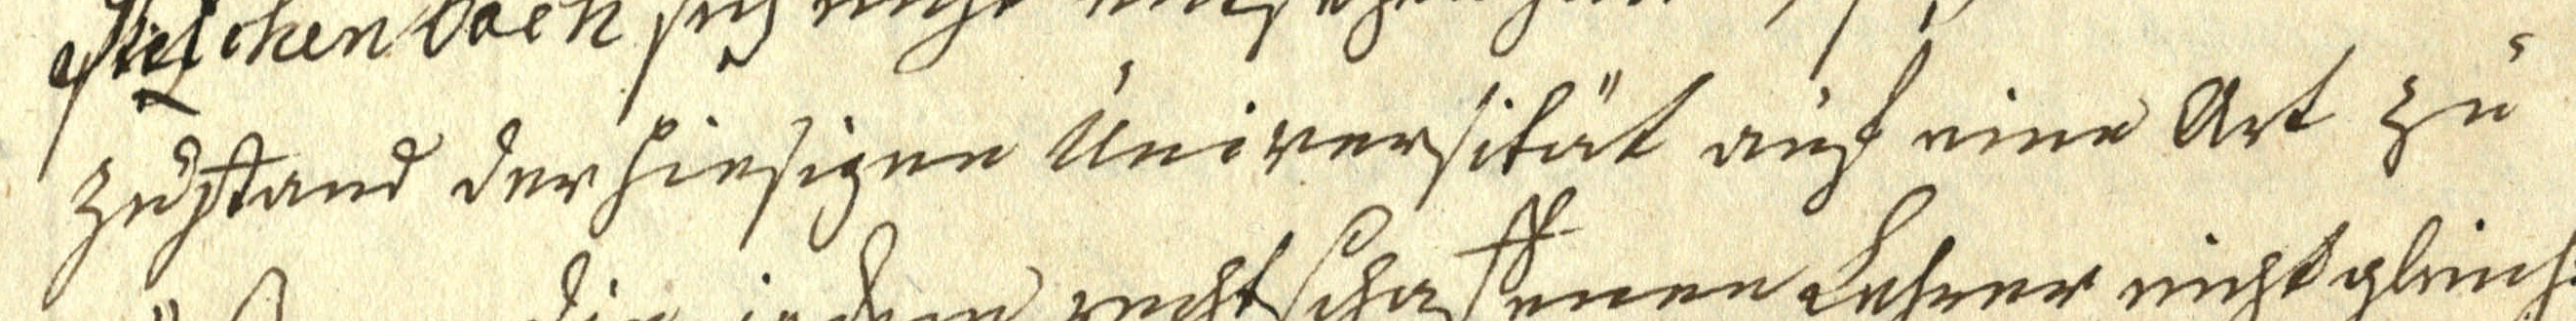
Zustand der hiesigen Universität auf eine Art zu
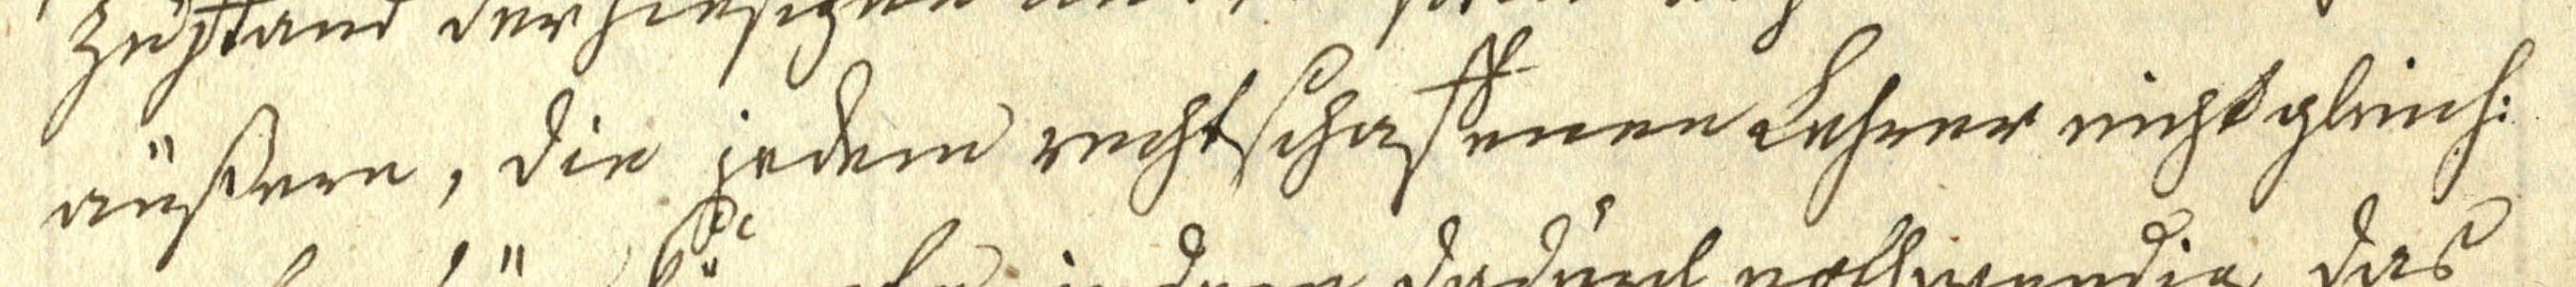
äußern, die jedem rechtschaffenen Lehrer nicht gleich¬
